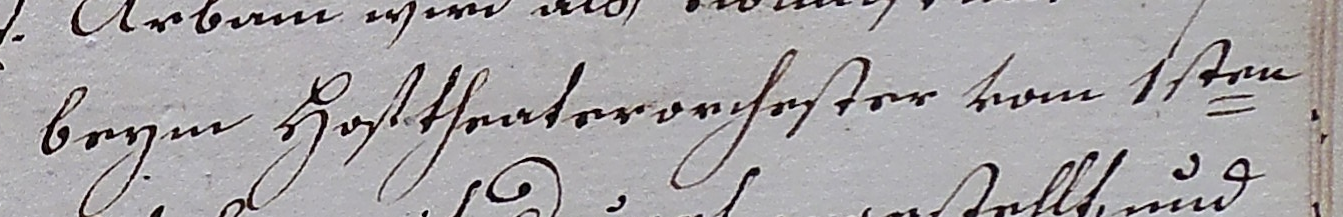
beym Hoftheaterorchester vom 1ste͇n
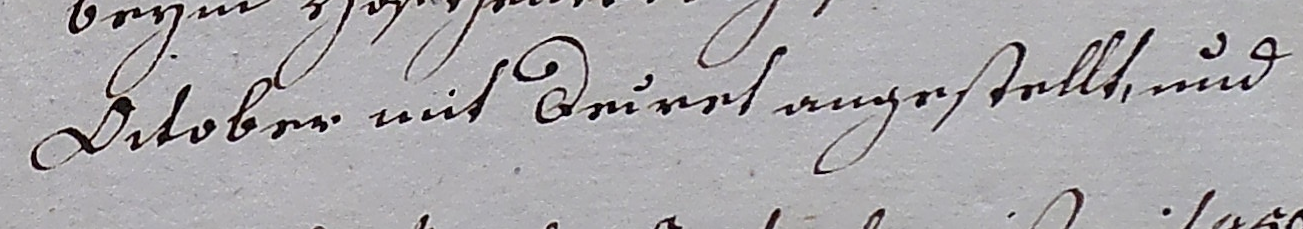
October mit Decret angestellt, und
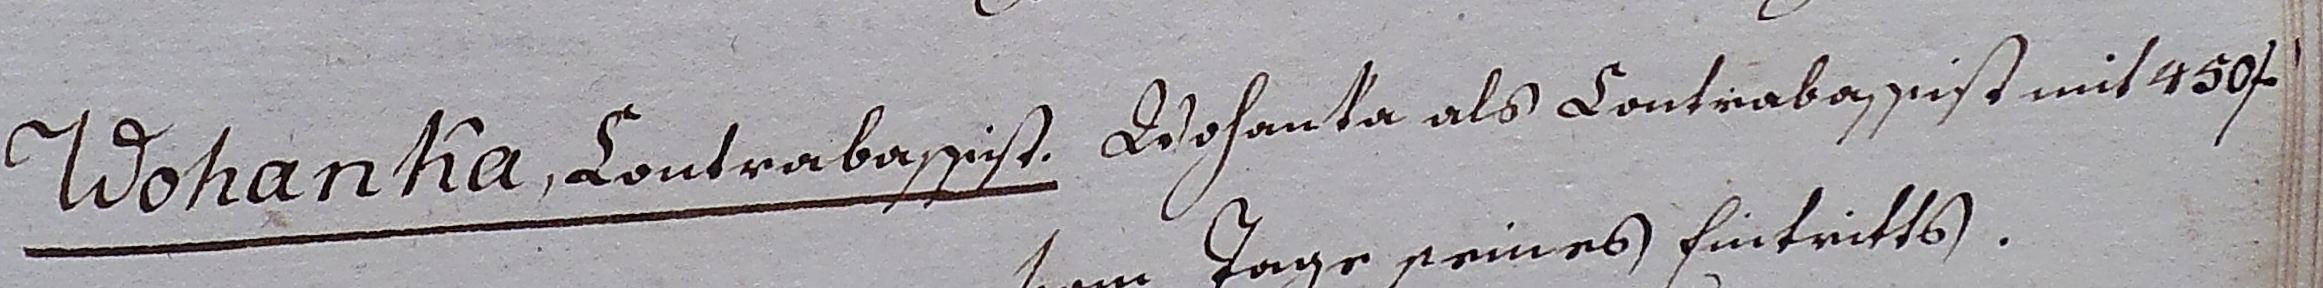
Wohanka, Contrabassist. Wohanka als Contrabassist mit 450fr.
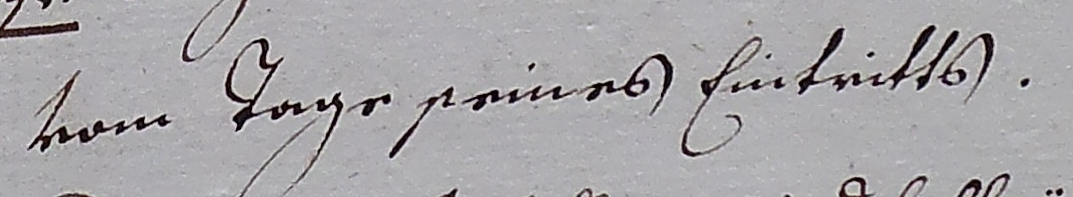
vom Tage seines Eintritts.
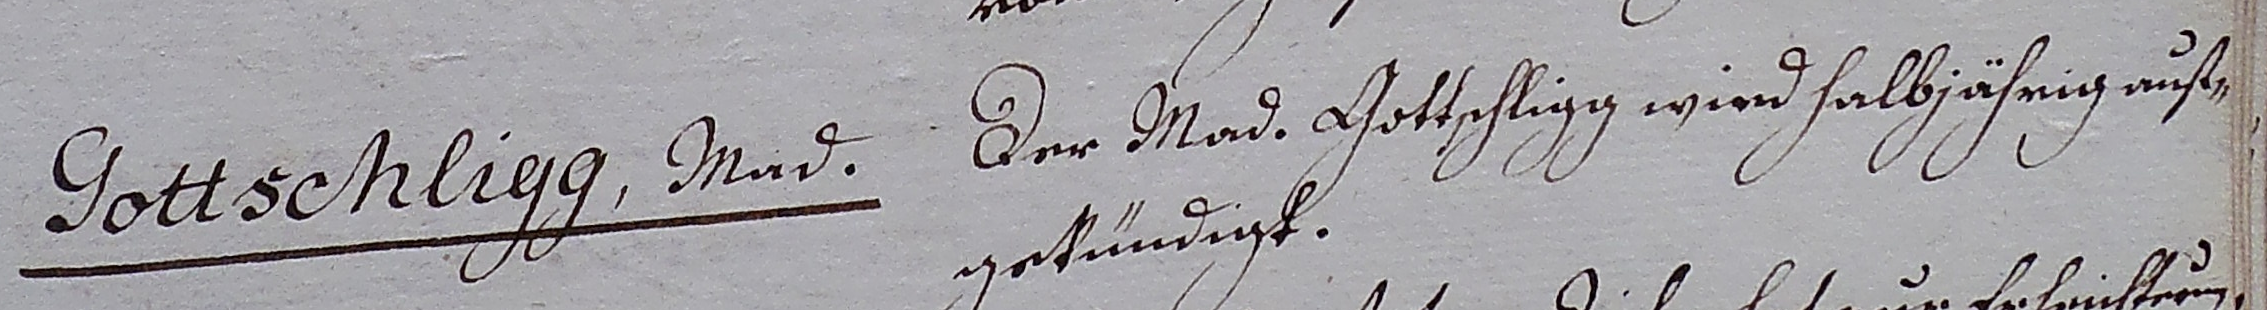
Gottschligg, Mad. Der Mad. Gottschligg wird halbjährig auf¬
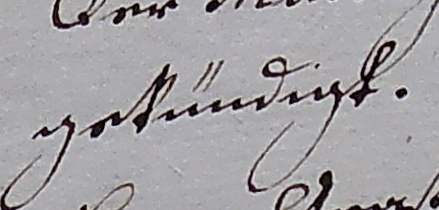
gekündigt.
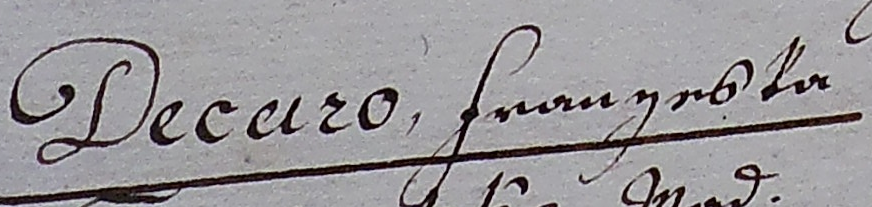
Decaro, Franzeska
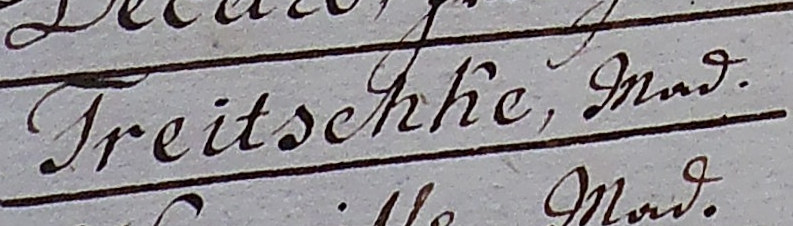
Treitschke, Mad.
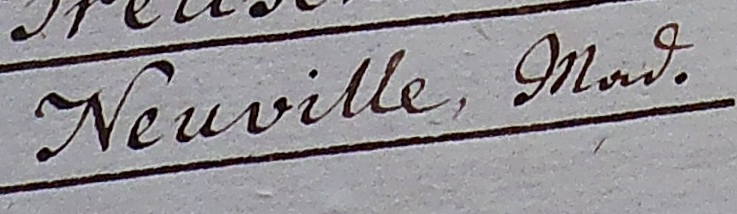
Neuville, Mad.
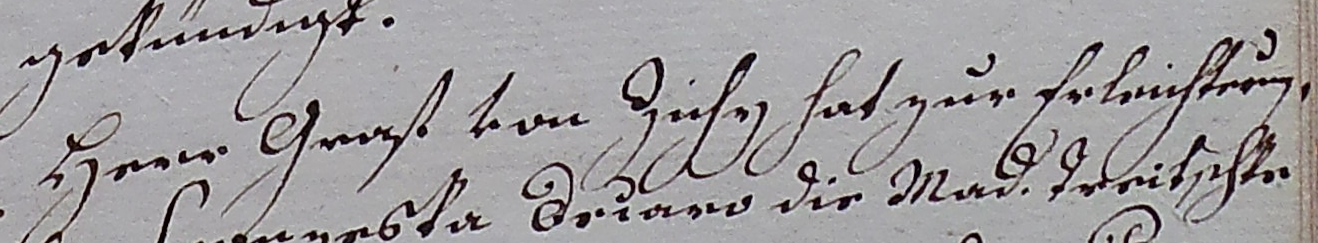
Herr Graf von Zichy hat zur Erleichterung,
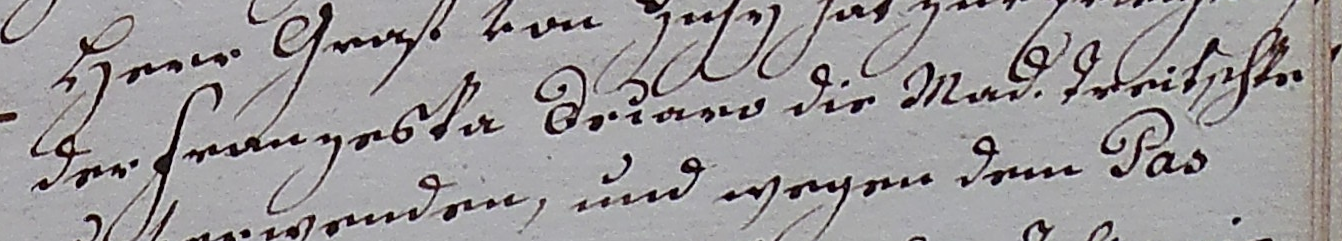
der Franzeska Decaro die Mad. Treitschke
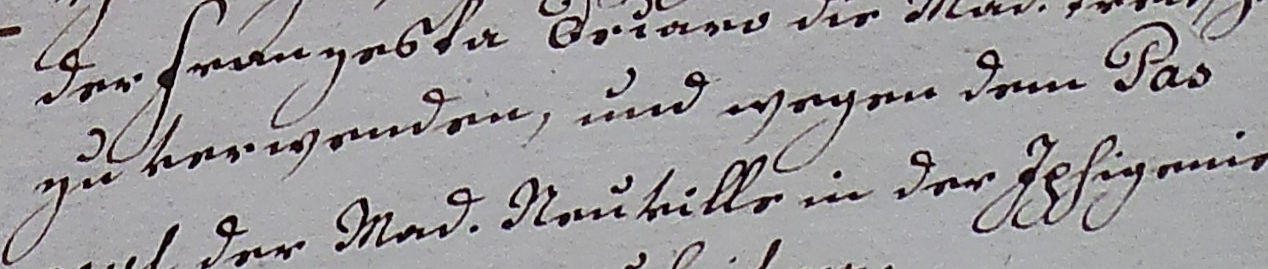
zuverwenden, und wegen dem Pas
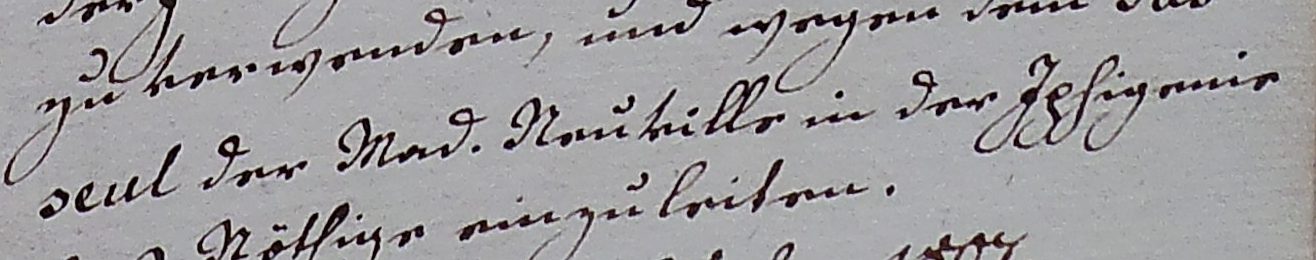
seul der Mad. Neuville in der Iphigenie
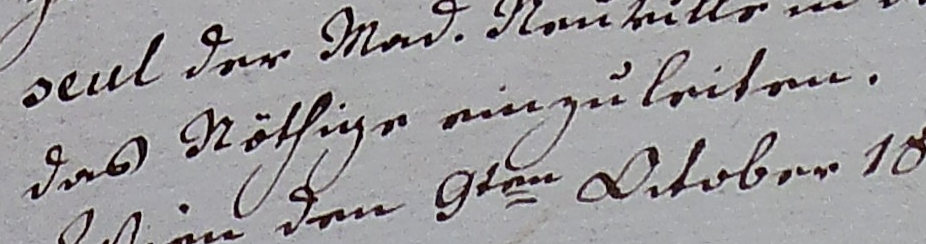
das Nöthige einzuleiten.
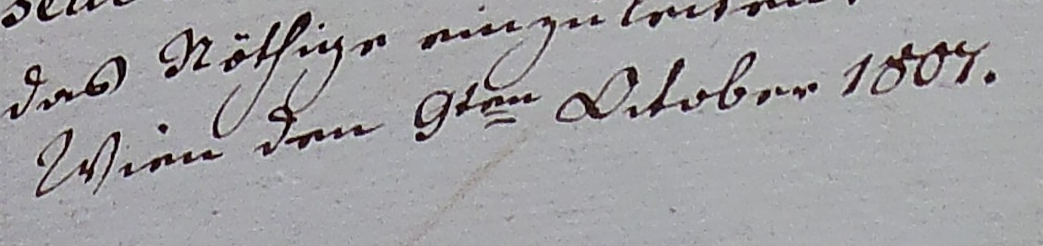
Wien den 9te͇n October 1807.
